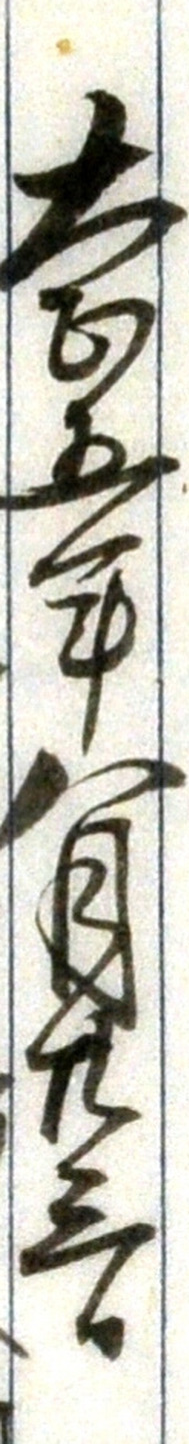大正五年八月廿三日
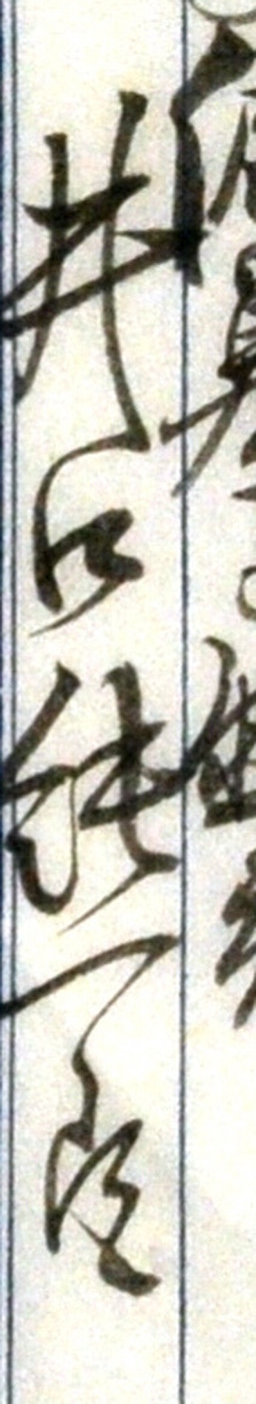井口純一郎
